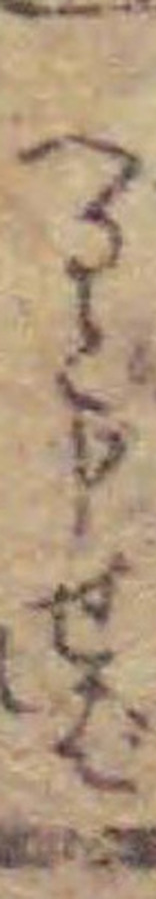へると申せば
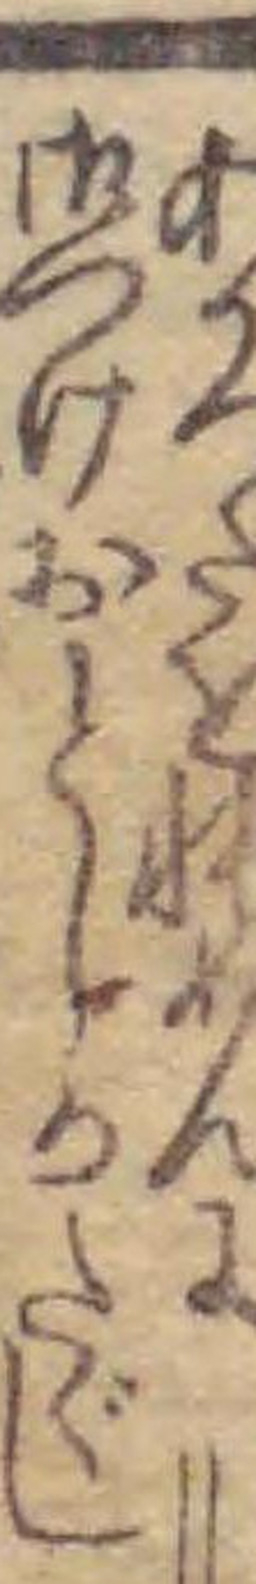御つけおとしかたゞし
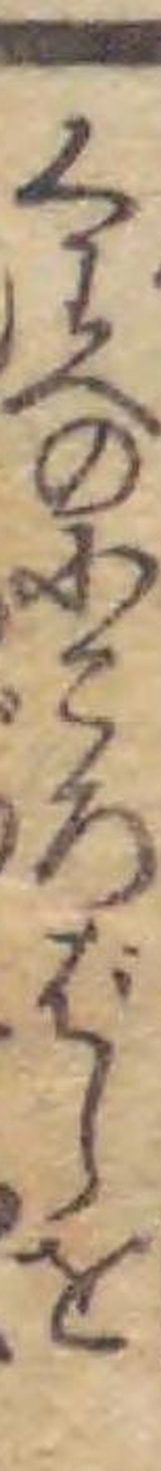くわへのにころばしを
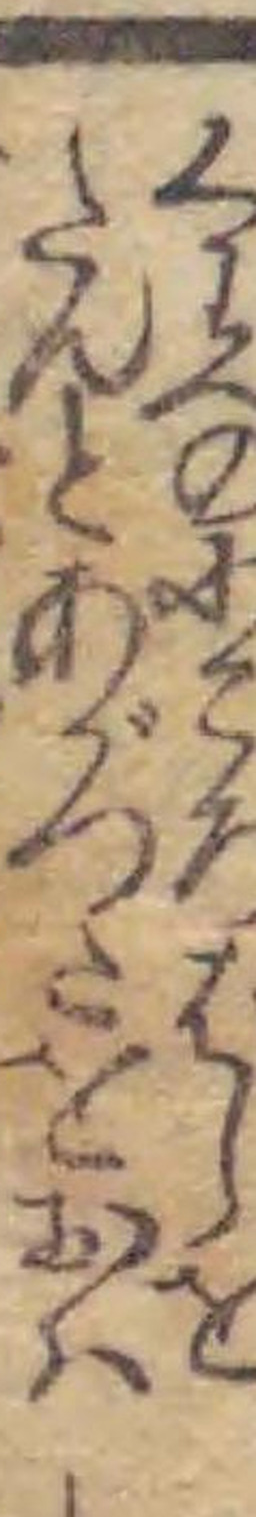たんとあがつたをおは
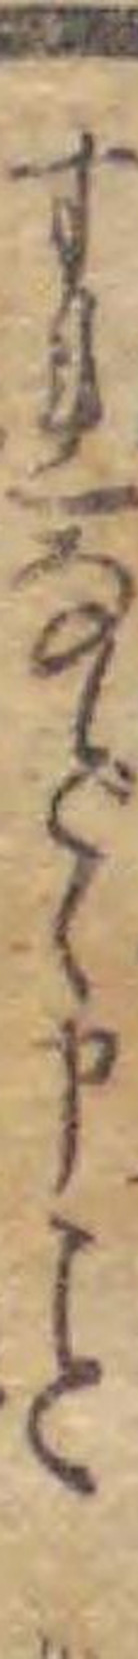すれなどゝ申こと
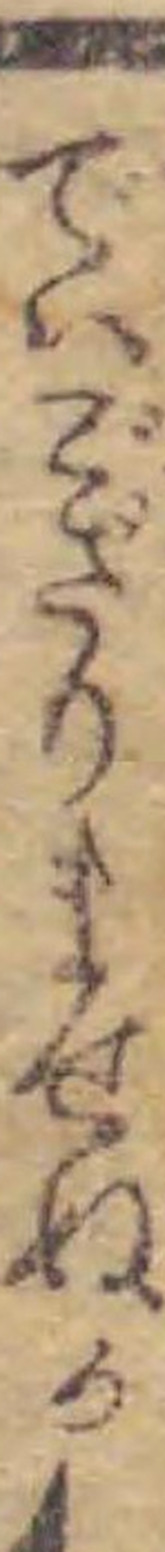ではござりませぬか
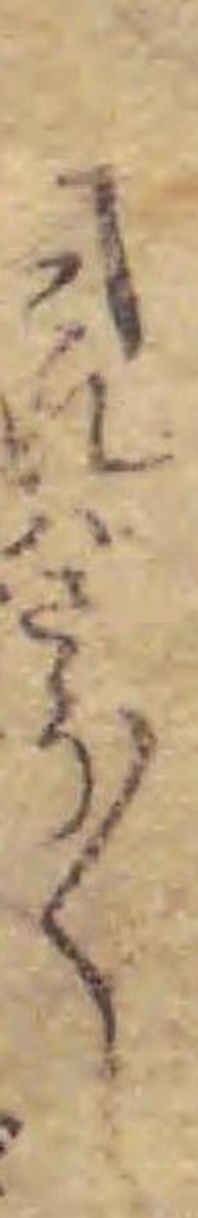〽これはさう〳〵
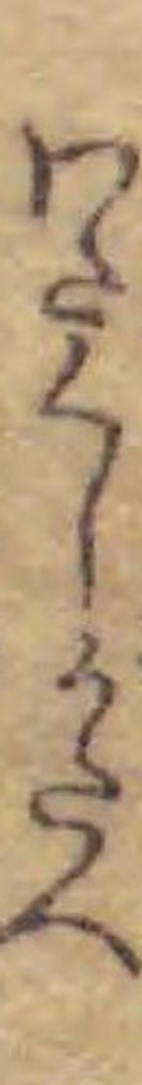わたくしかたへ
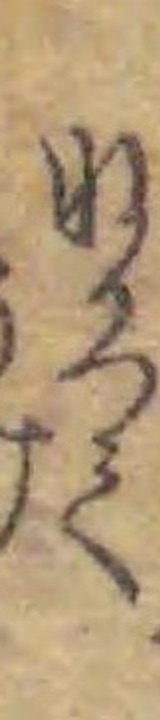ねかつて

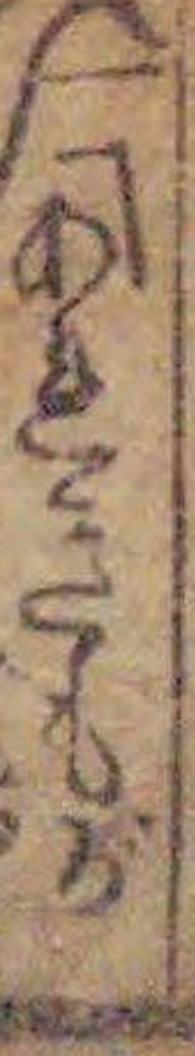〽あれきもが
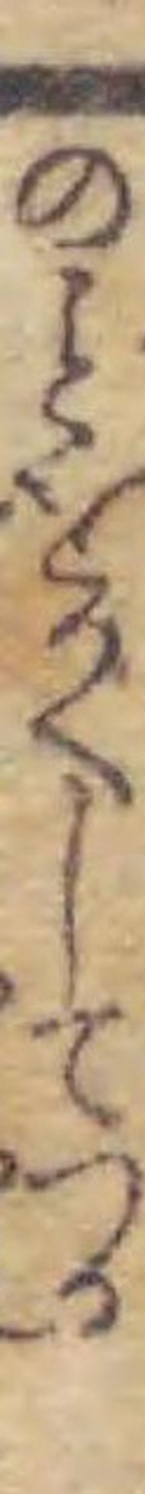のことをかくしてつか
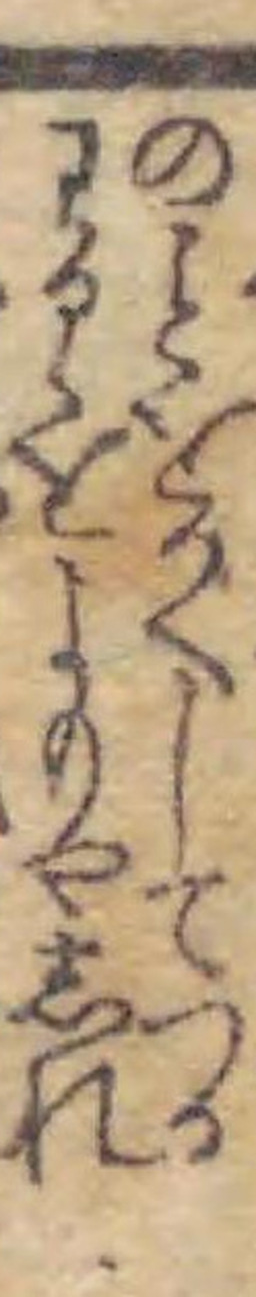わるゝをよもやしれ
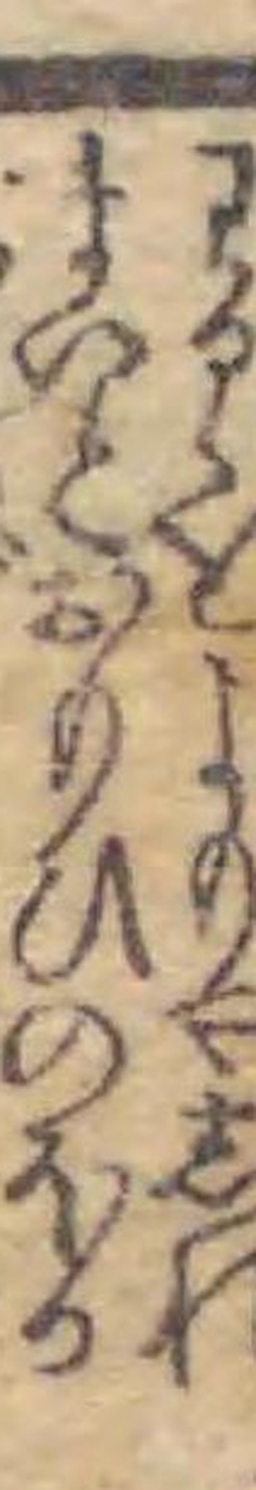まいとおもひのほか
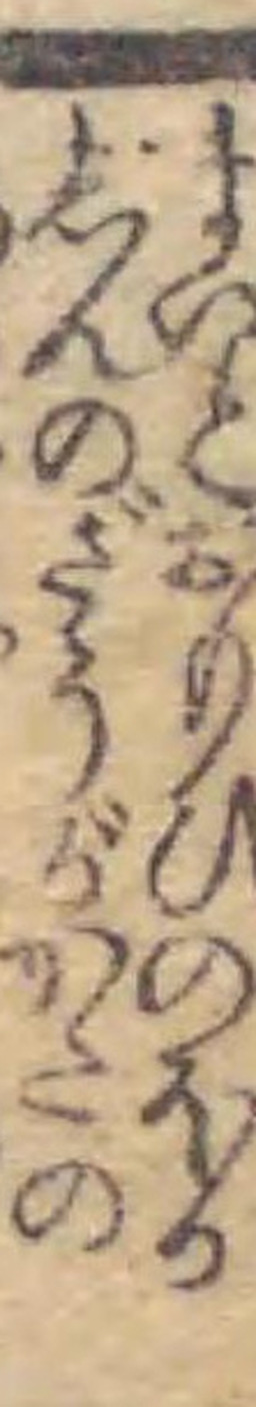しんのざうがかたの
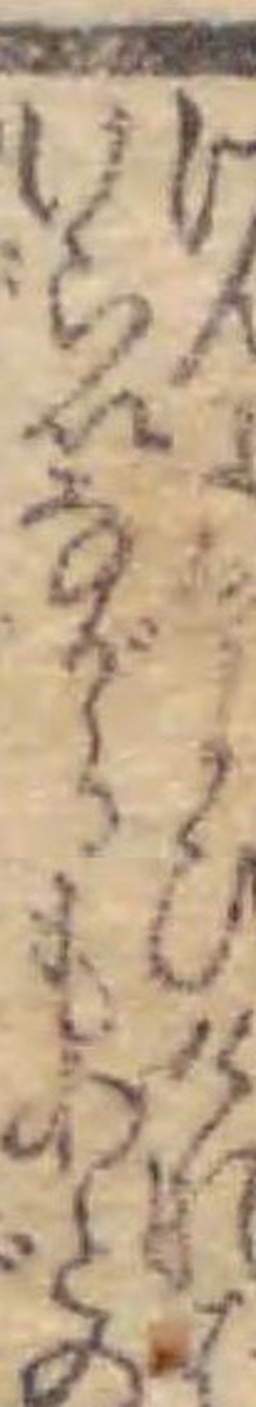けらいながらもあとの
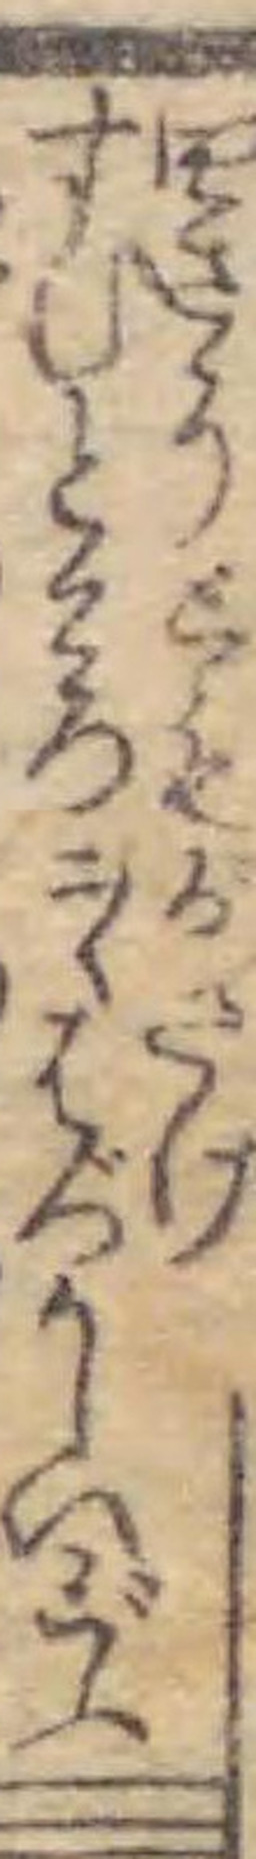すむところヽはづかしいどふ
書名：十四傾城腹之内 : 3巻
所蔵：国立国会図書館 National Diet Library, JAPAN
